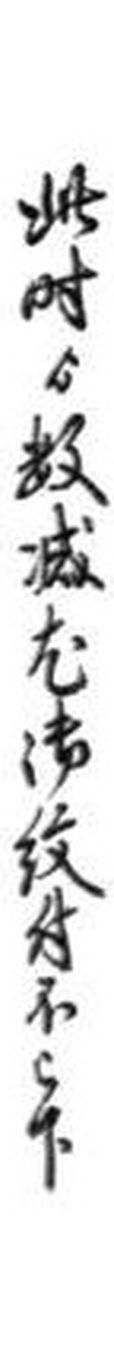此時ゟ数減尤御紋付不被下
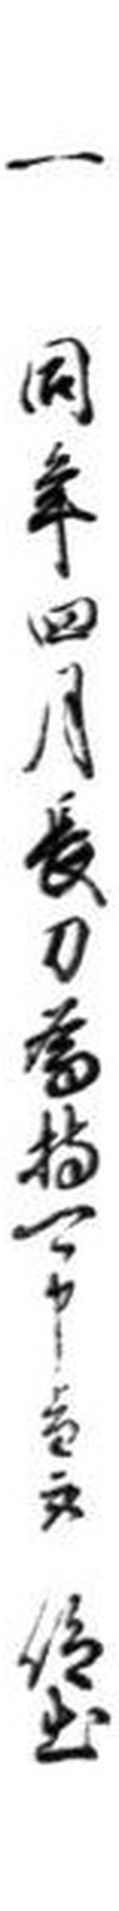一同年四月長刀為持可申旨被仰出
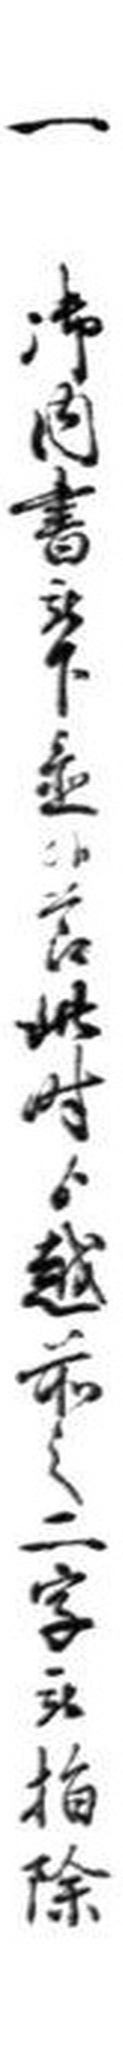一御内書被下置候節此時ゟ越前之二字被指除
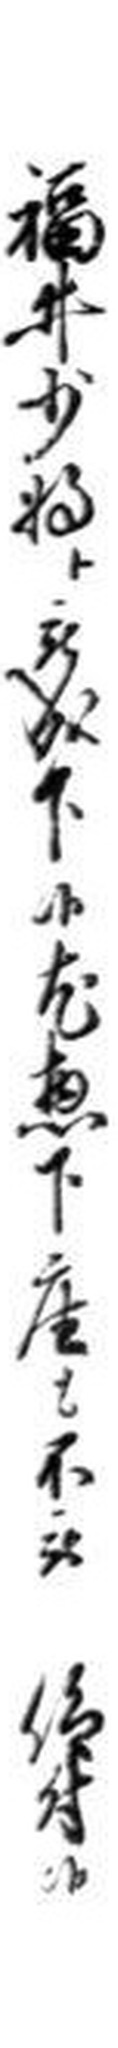福井少将ㇳ被成下候尤惣下座も不被仰付候
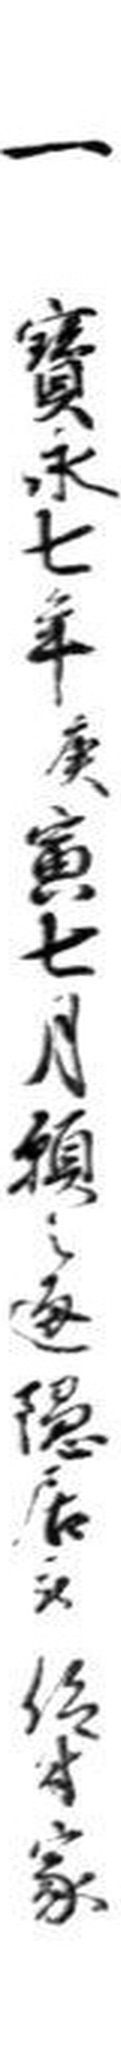一宝永七年庚寅七月願之通隠居被仰付家
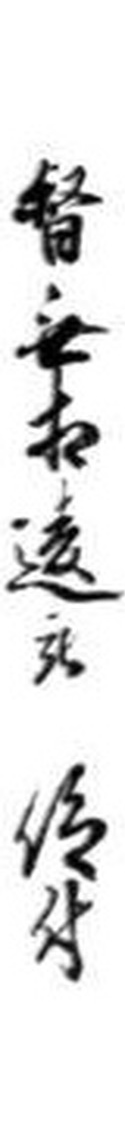督無相違被仰付
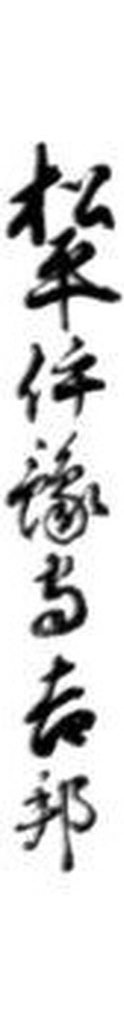松平伊予守吉邦
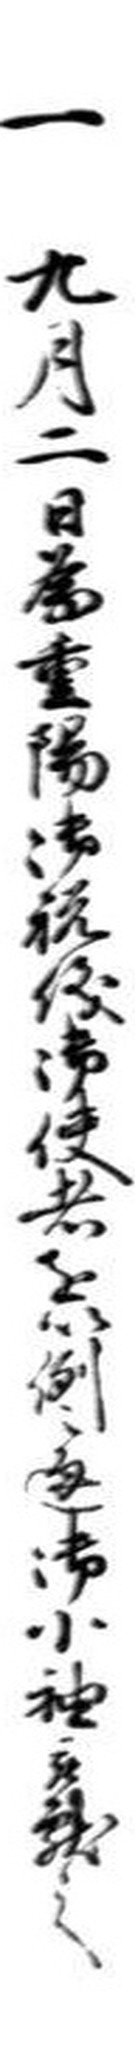一九月二日為重陽御祝儀御使者を以例之通御小袖被献之
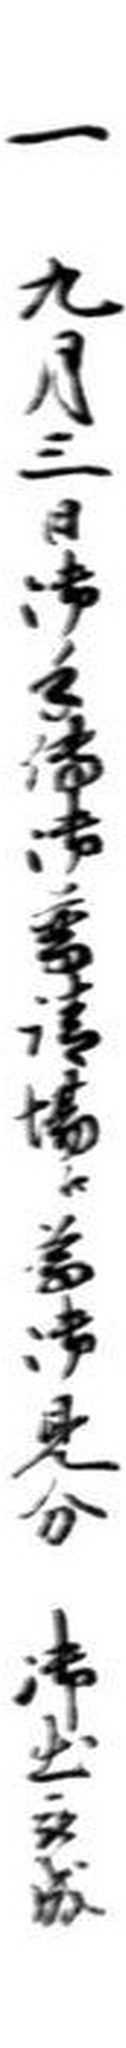一九月三日御手伝御普請場江為御見分御出被成
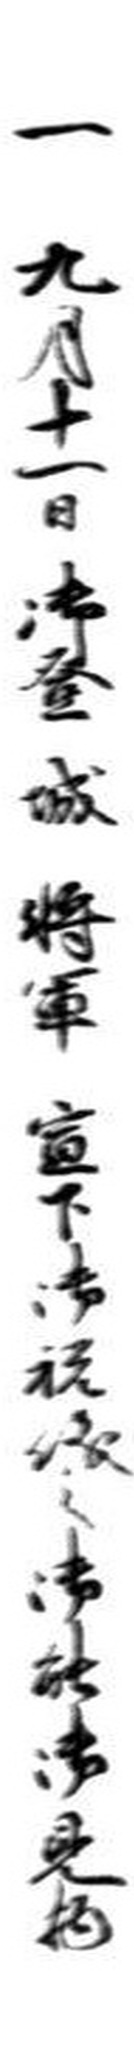一九月十一日御登城将軍宣下御祝儀之御能御見物
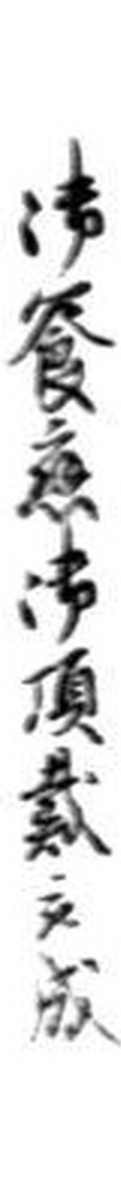御饗応御頂戴被成
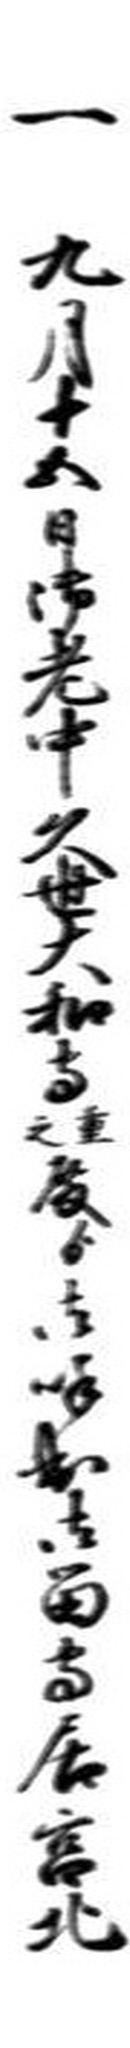一九月十五日御老中久世大和守重之殿ゟ御呼出御留守居宮北
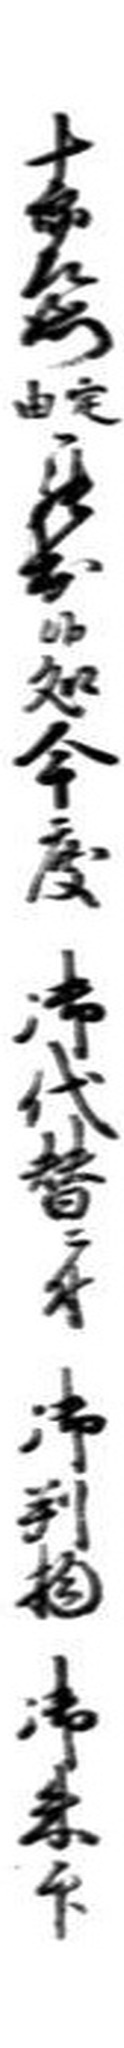十郎左衛門定由罷出候処今度御代替ニ付御判物御朱印
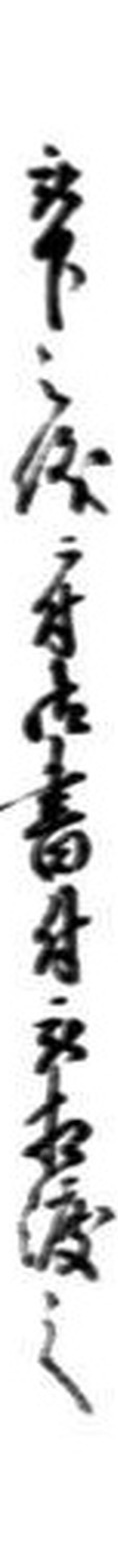被下之儀ニ付御書付被相渡之
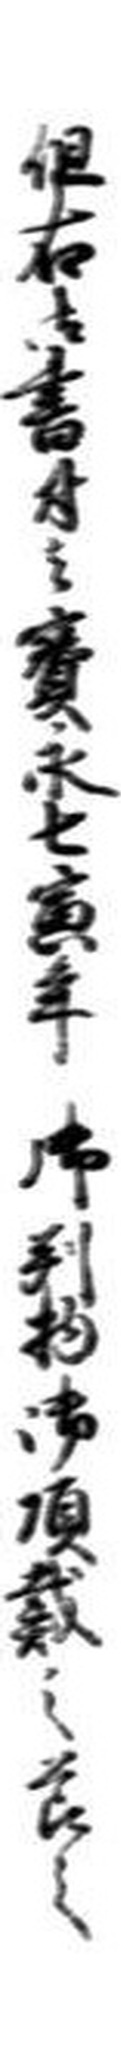但右御書付者宝永七寅年御判物御頂戴之節之
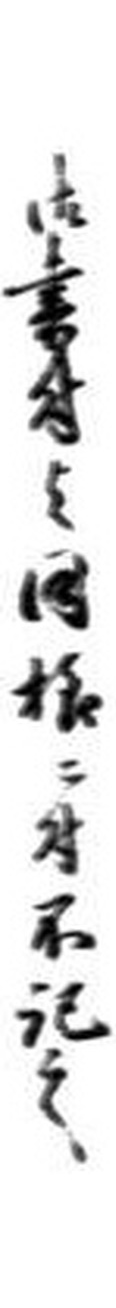御書付と同様ニ付不記之
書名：家譜 三十一 吉邦公 享保元年
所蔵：福井県文書館 Fukui Prefectural Archives
